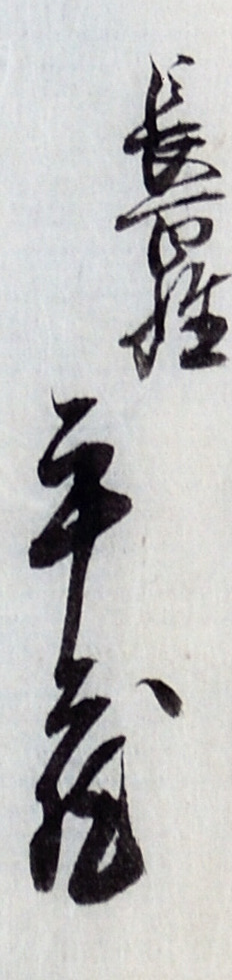長百姓平蔵
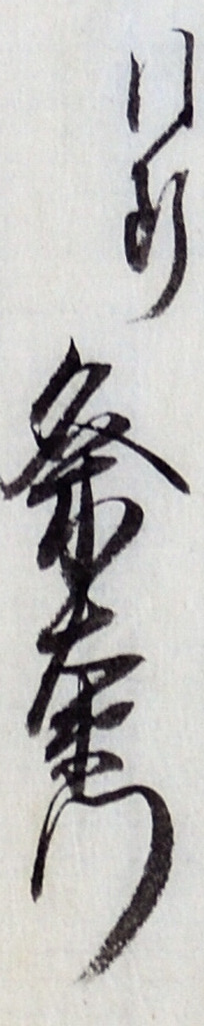同断久米右衛門
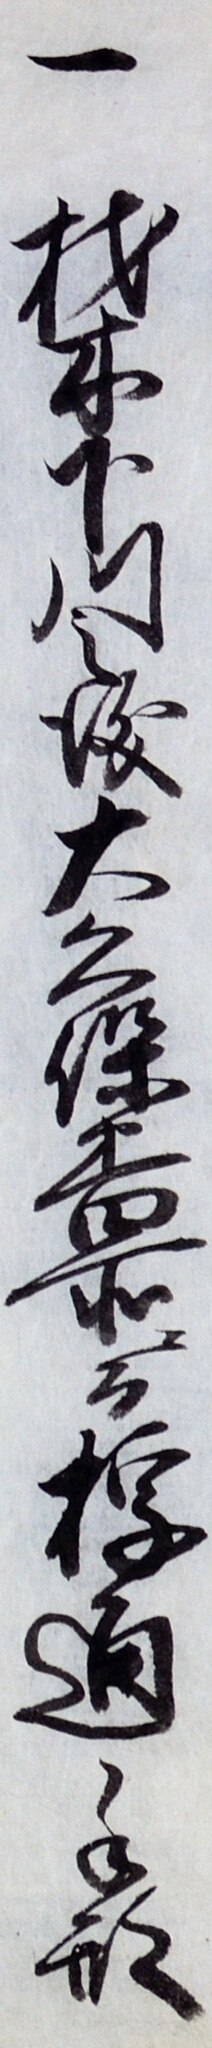一材木下川之儀大久保番所ニ而桴通手形
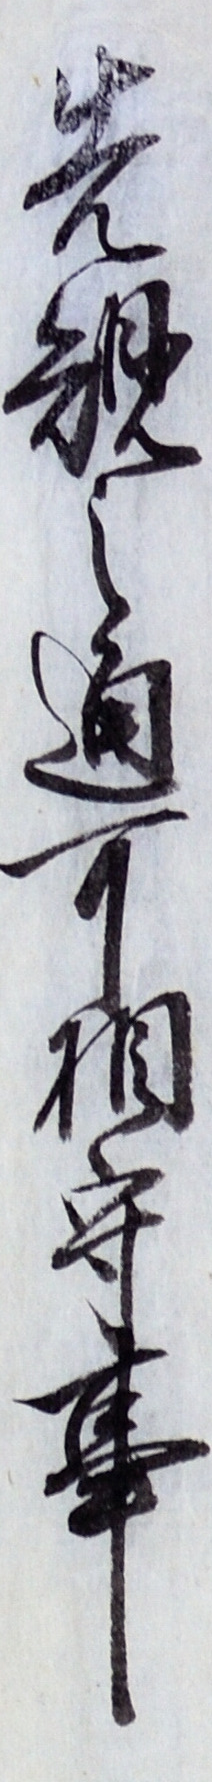先規之通可相守事

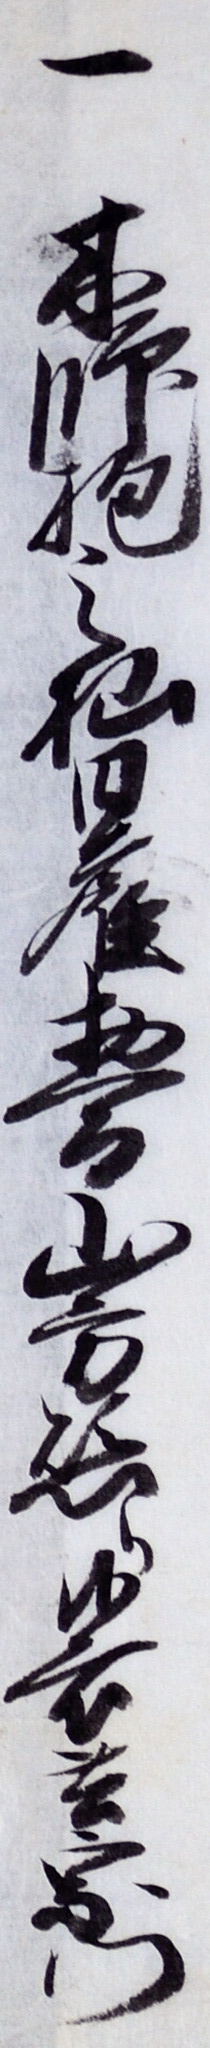一木師抱之杣日雇惣而山方リ候者共宗門
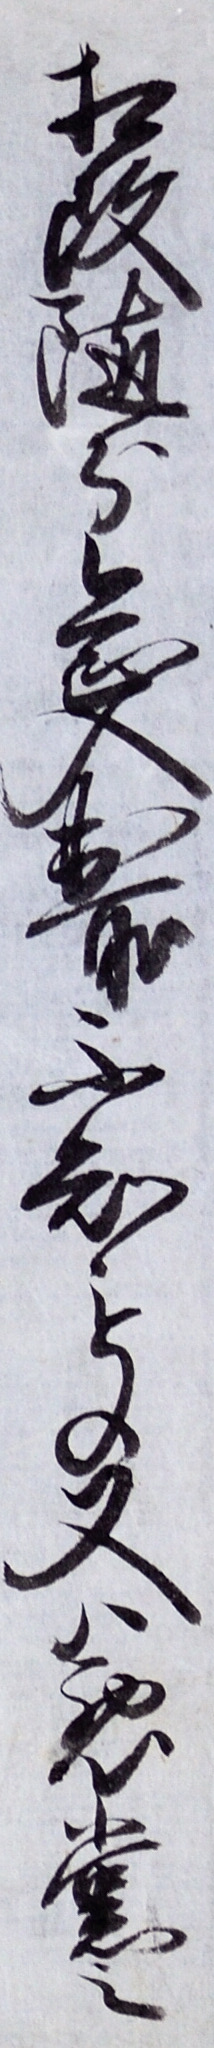相改随分念入出所不知もの又ハ悪党之
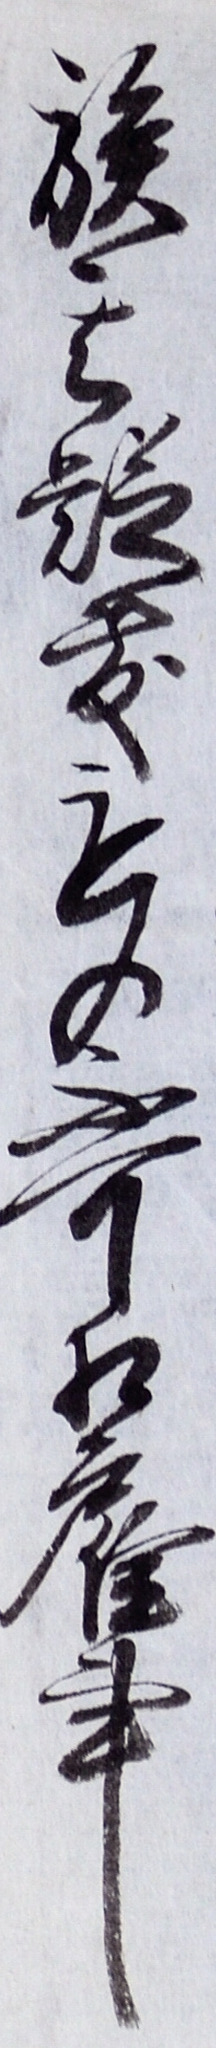族其疑敷もの不可相雇事
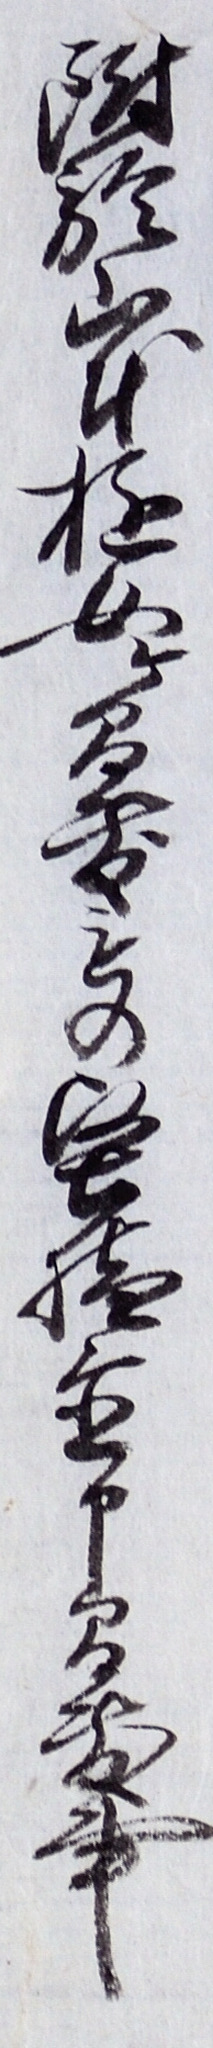附於山本遊女ケ間敷もの堅指置申間敷事
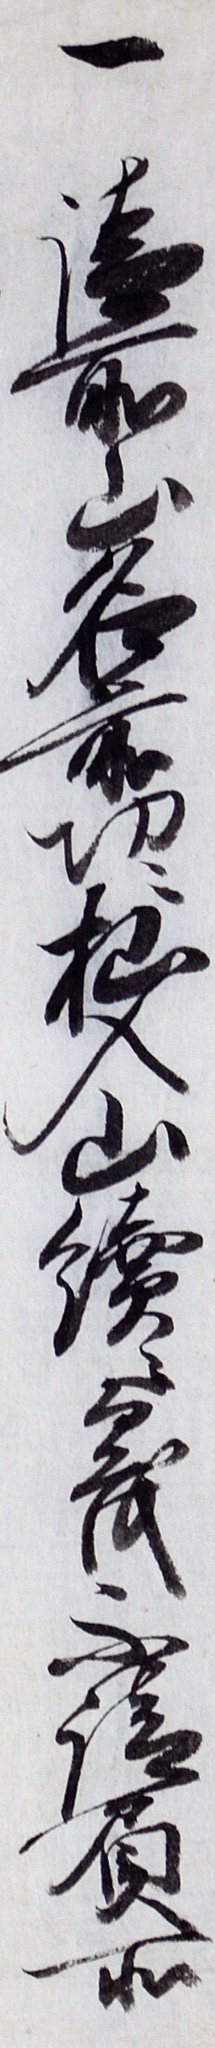一請所山名所切ニ杣入山続ニ而も不請負所
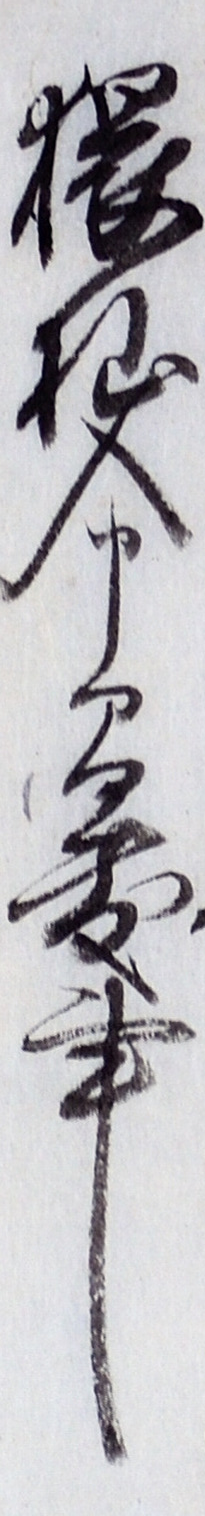猥杣入申間敷事
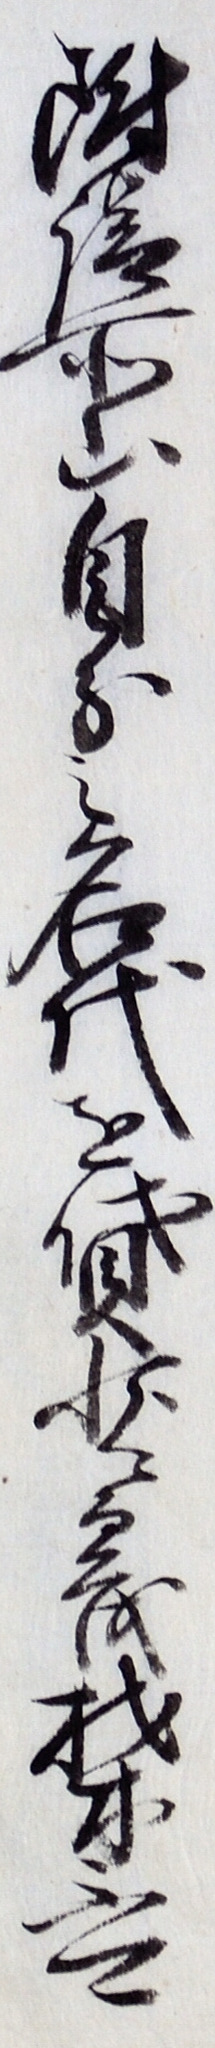附請所山自分之名代を貸少ニ而も材木不可
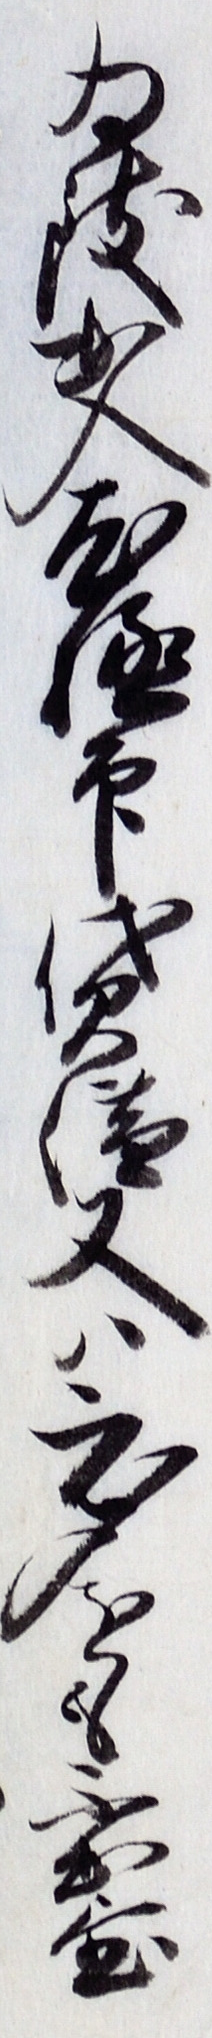為致出入尤極印貸借又ハ元〆をも不出置
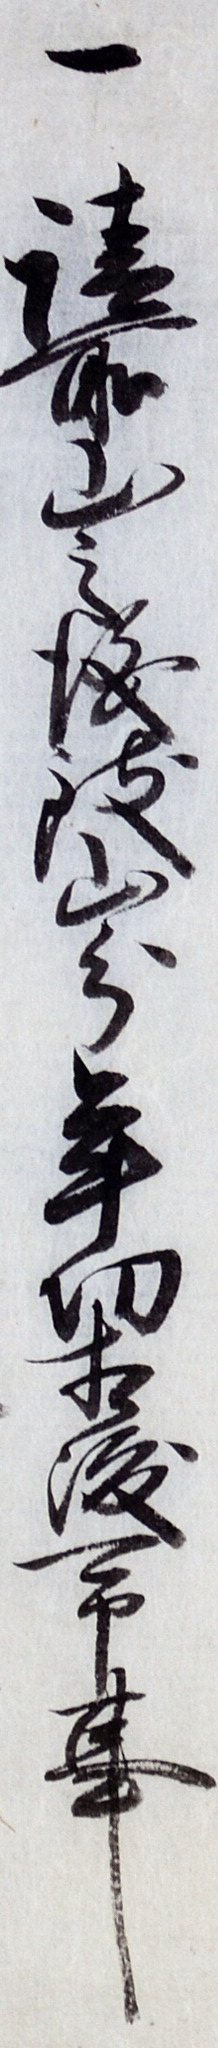一請所山之儀致山分年切相渡可申事
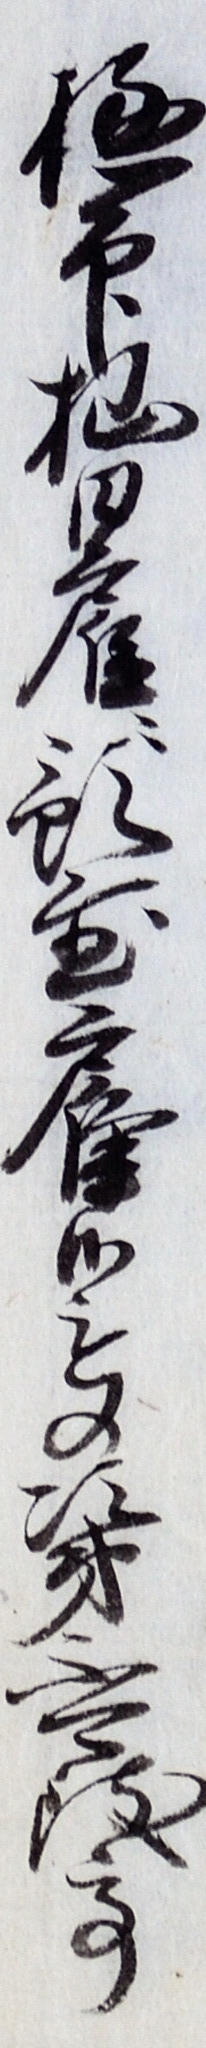極印杣日雇ニ預置雇候もの次第不可致事
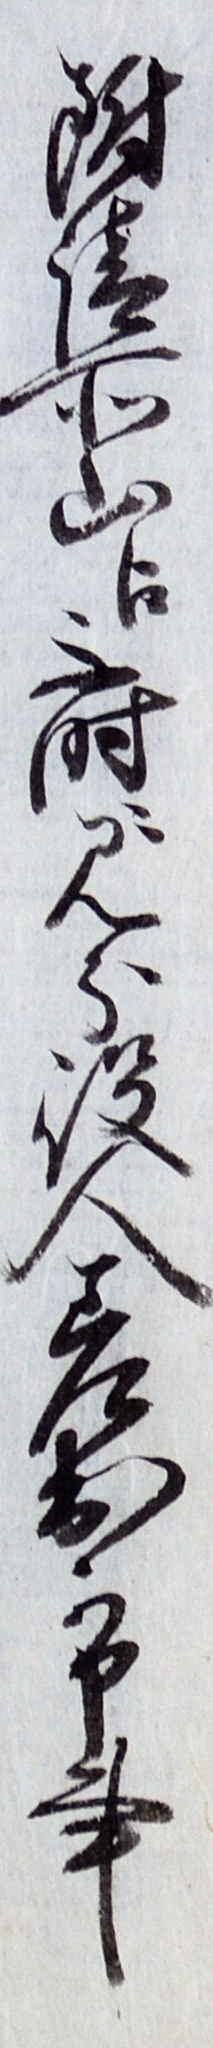附請所山江不時ニ見分役人差出可申事
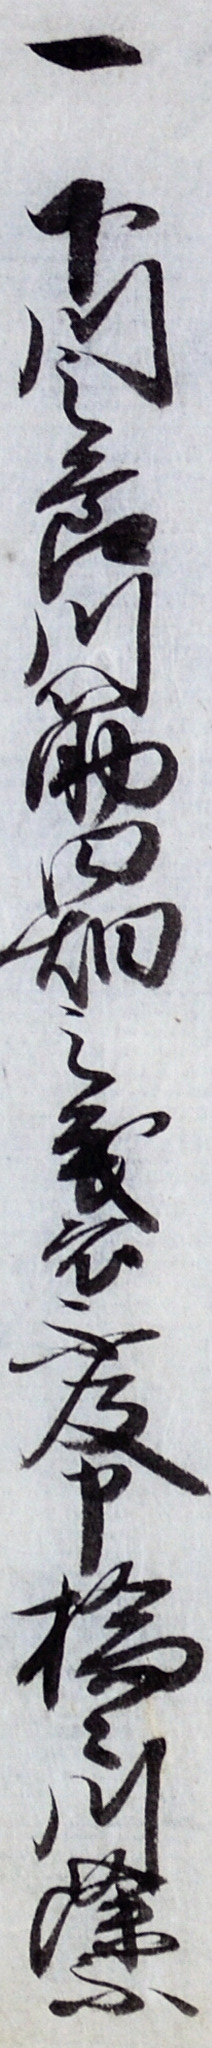一下川之節川筋田畑之義者不及申橋々川除不
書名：御持山御払掟書願書控
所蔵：伊那市立高遠町図書館・合同会社AMANE
